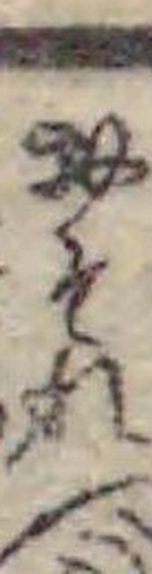おそれ
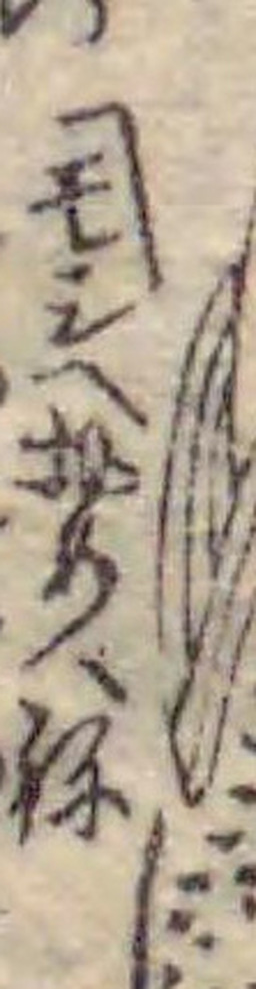〽モシヘおめへね
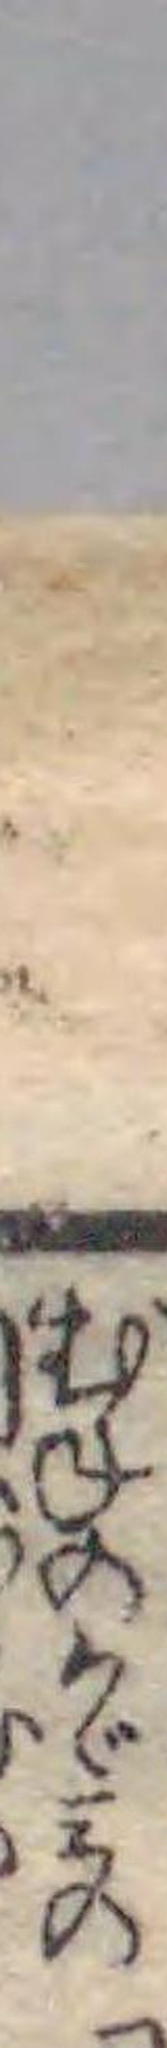むねのかゞみの
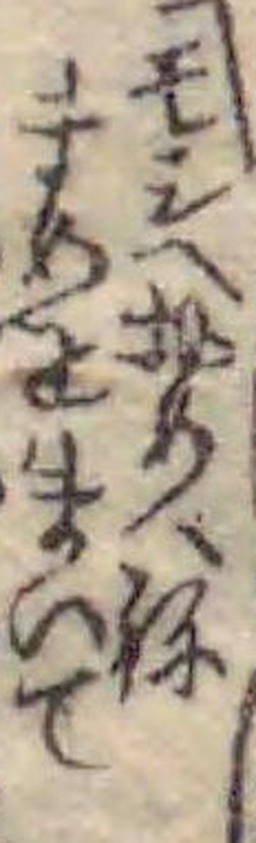まめをまいて
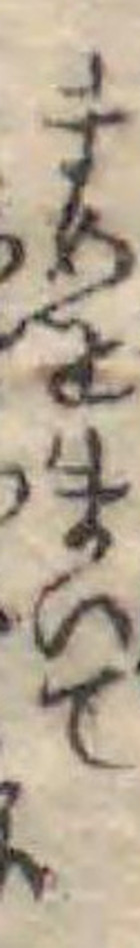まめをまいて
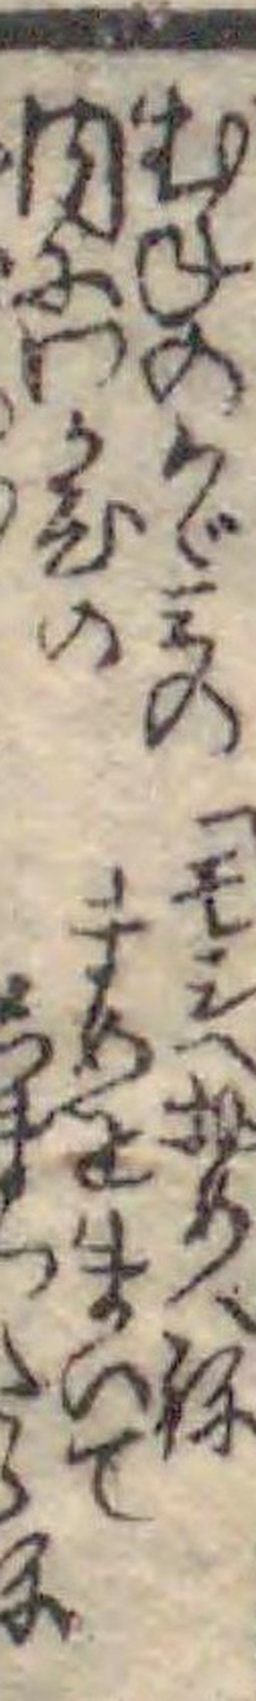内にわか心の
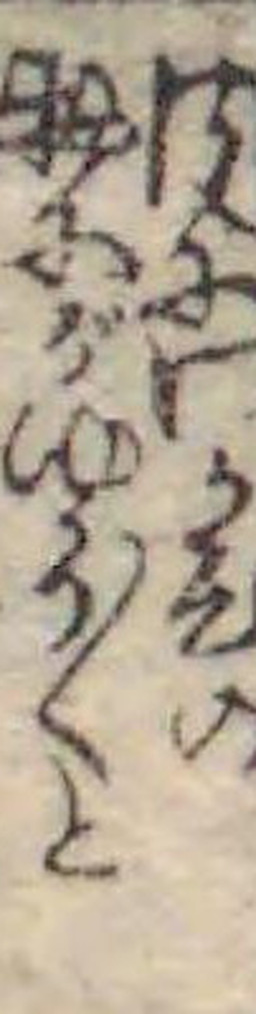おにがゆう〳〵と
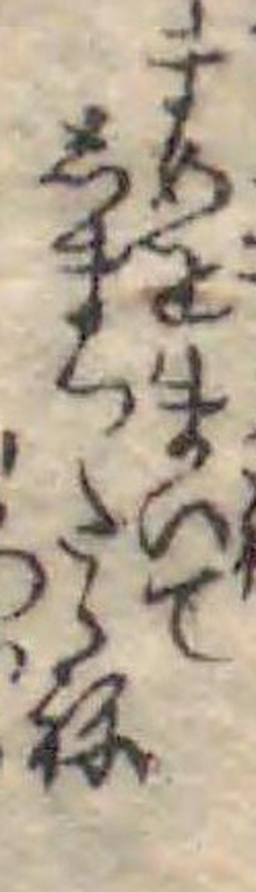しまつたらね
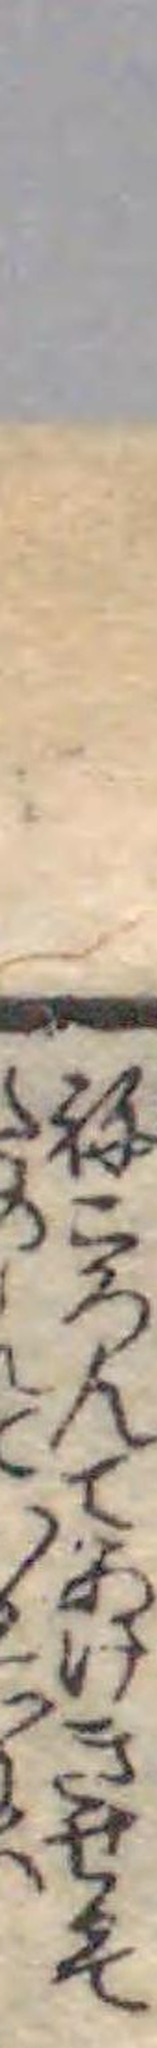ねころんてあけきせるて
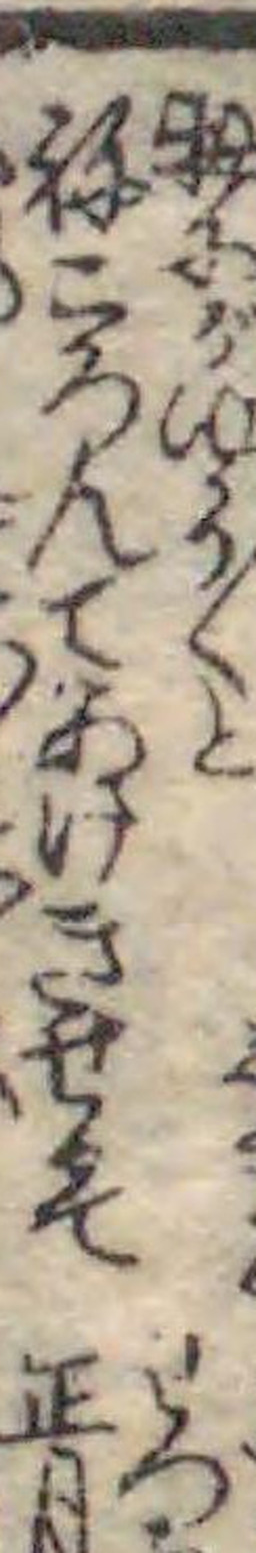ねころんてあけきせるて
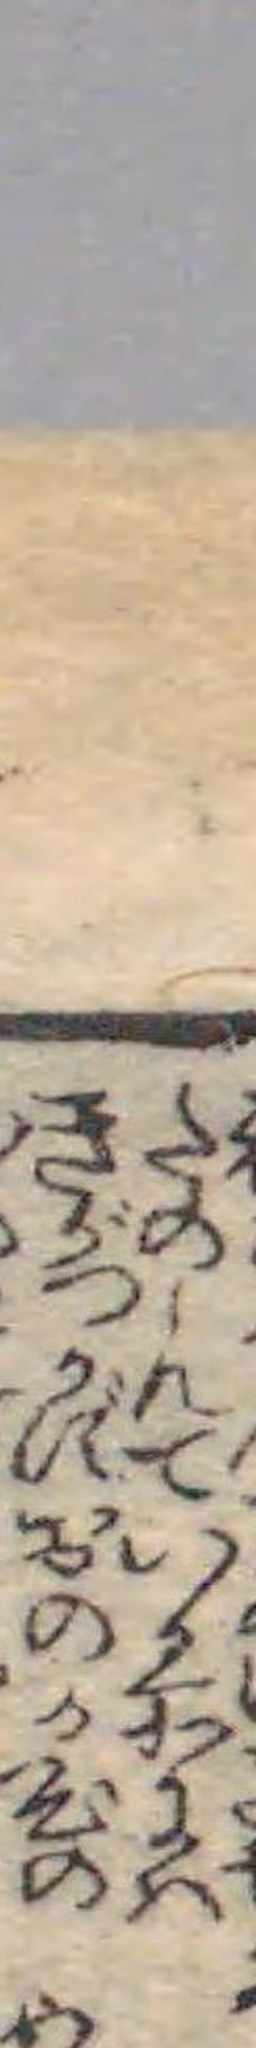きがつかずおのか心の
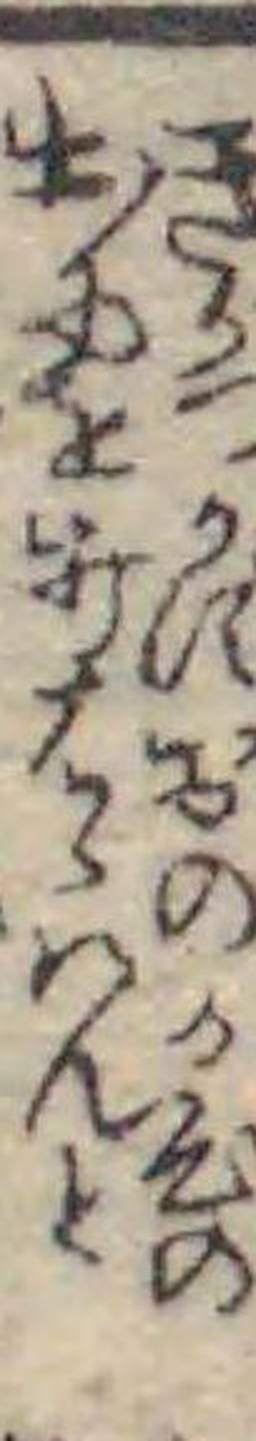おにを打ちはらはんと
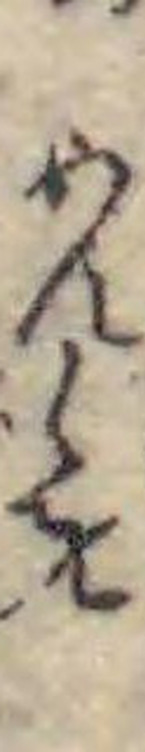めんらを
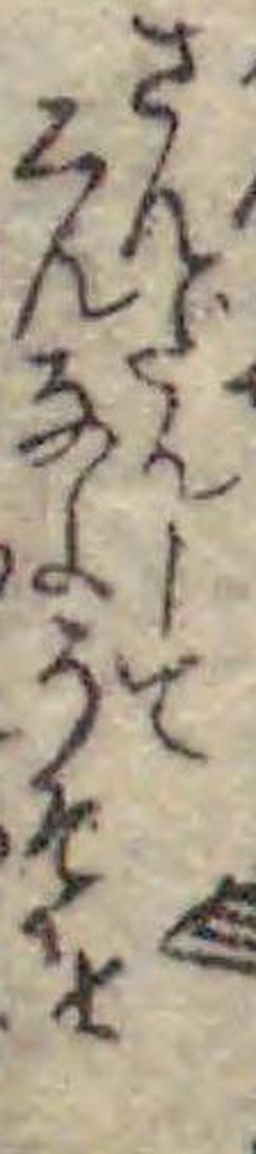くんなようそを
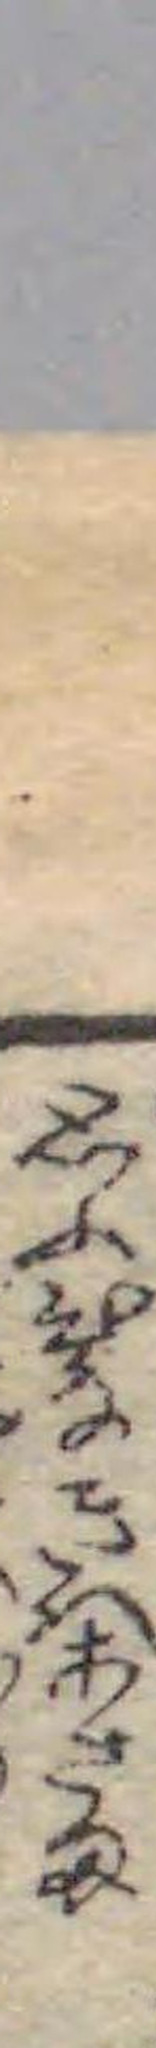思ふ心なきはあさま
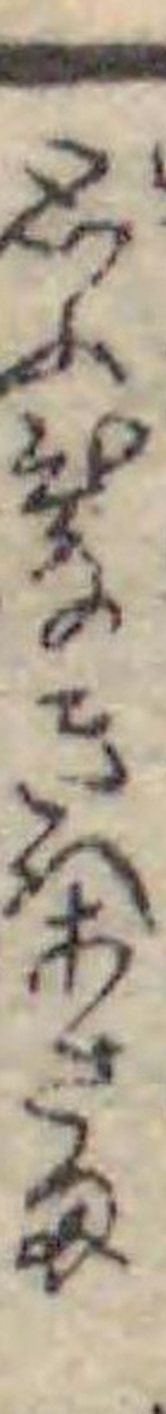思ふ心なきはあさま
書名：人心鏡写絵 : 3巻
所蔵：国立国会図書館 National Diet Library, JAPAN
